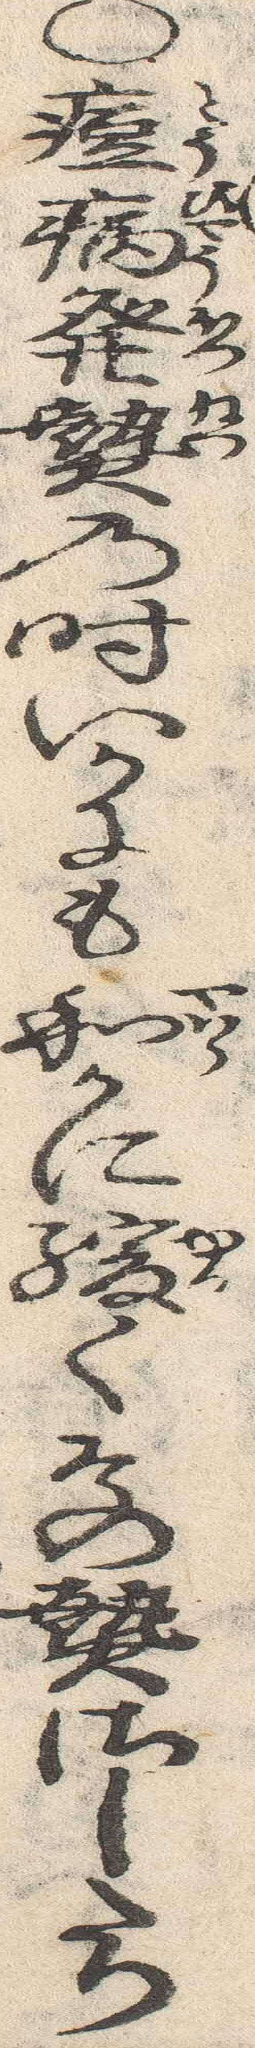○痘病発熱の時いかにも和かに緩くその熱さしたり
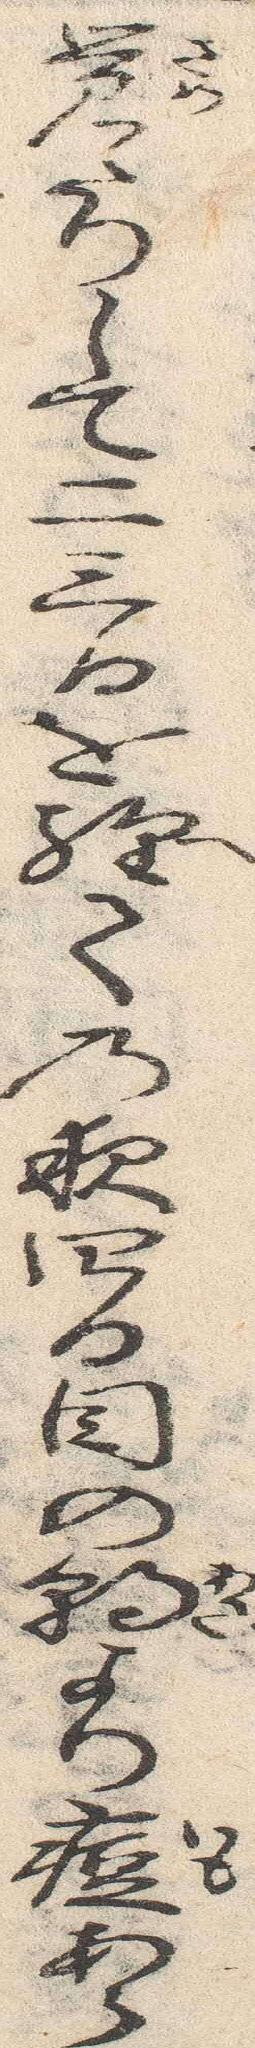覚たりして二三日を経ての夜四日目の朝より痘あら
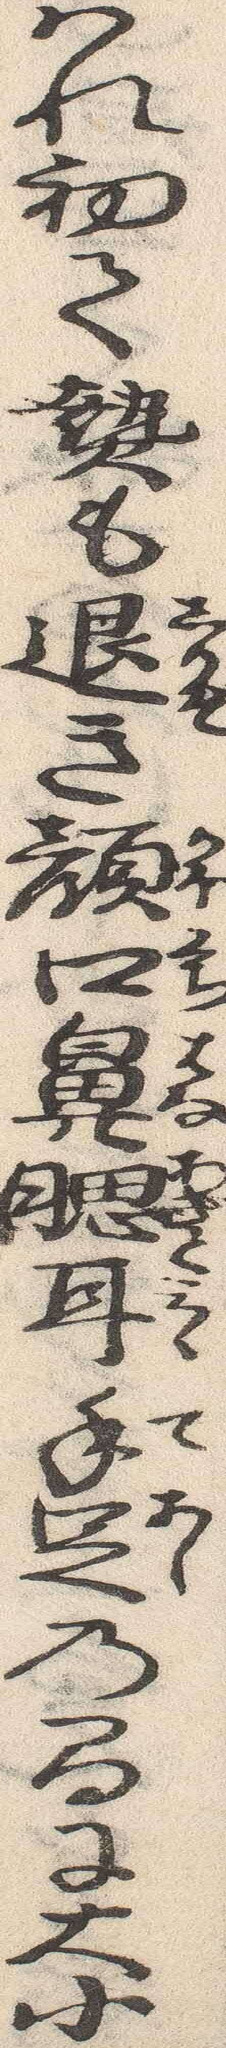はれ初て熱も退き顔口鼻顋耳手足の間に大小
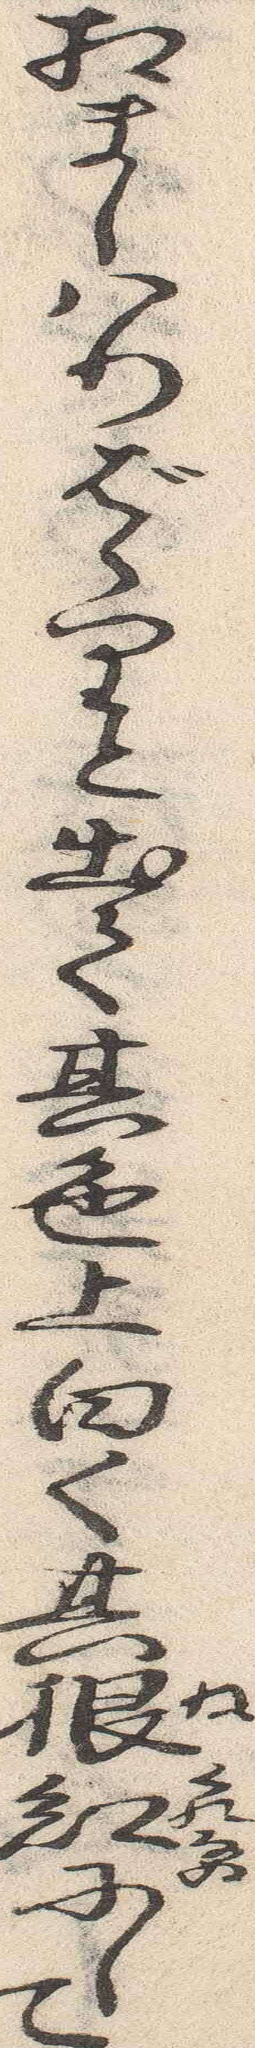相ましはりばらりと出て其色上白く其根紅にして
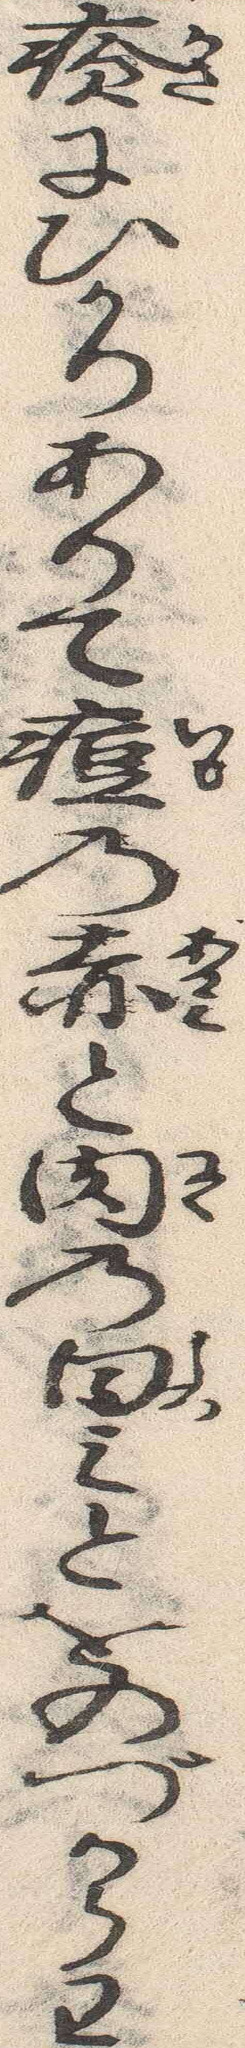瘡にひかりありて痘の赤と肉の白みとをのづからわ
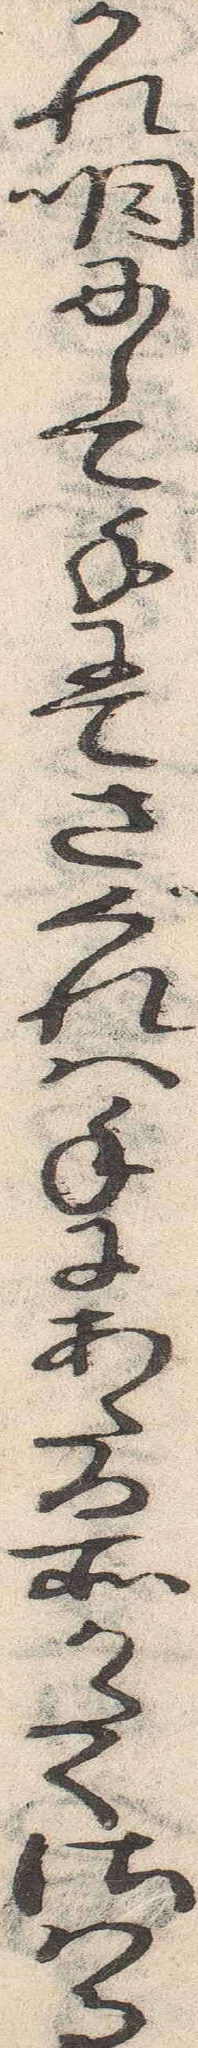かれ明にして手にてさぐれは手にあたる所かたくさはる
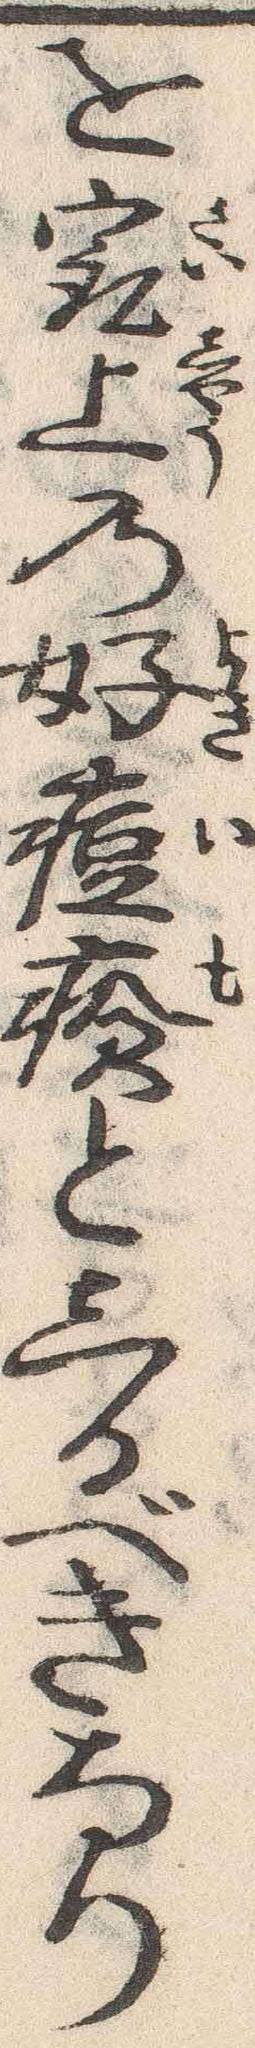を最上の好痘瘡としるべきなり
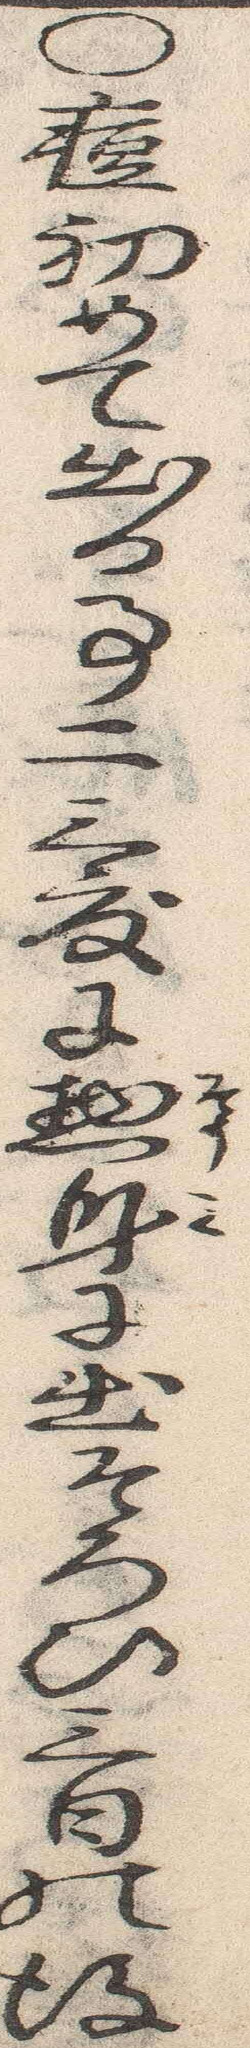○痘初めて出る事二三度に総身に出そろひ三日の後
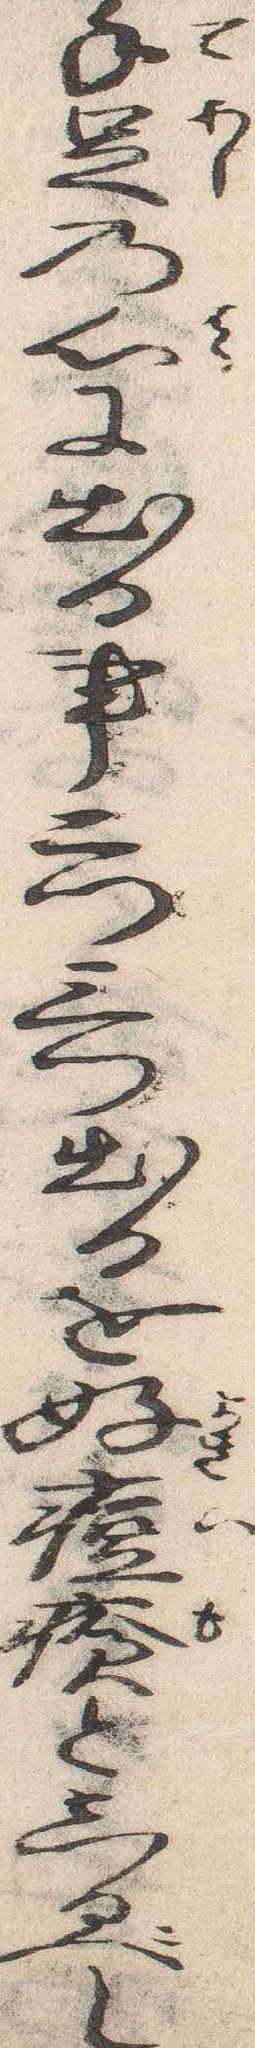手足の心に出る事二つ三つ出るを好痘瘡としるべし
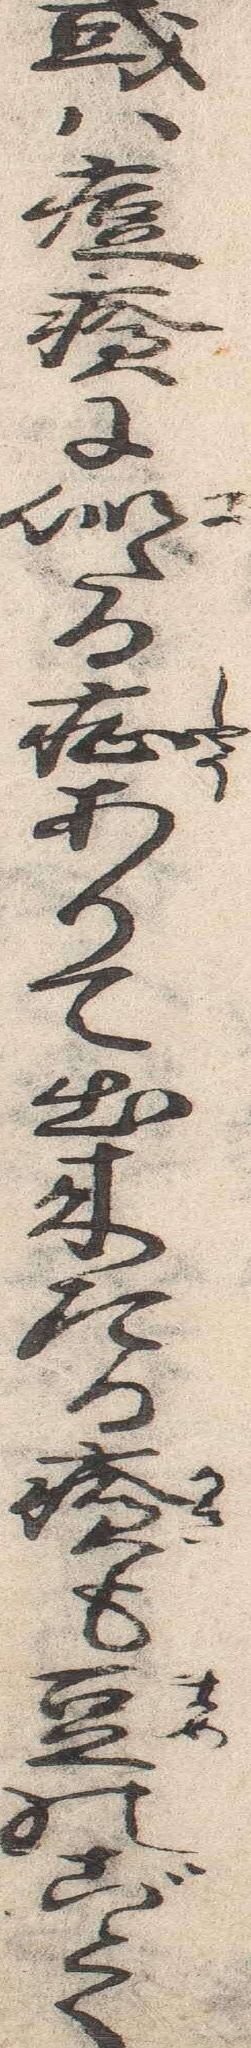或は痘瘡に似たる症ありて出来たる瘡も豆のごとく
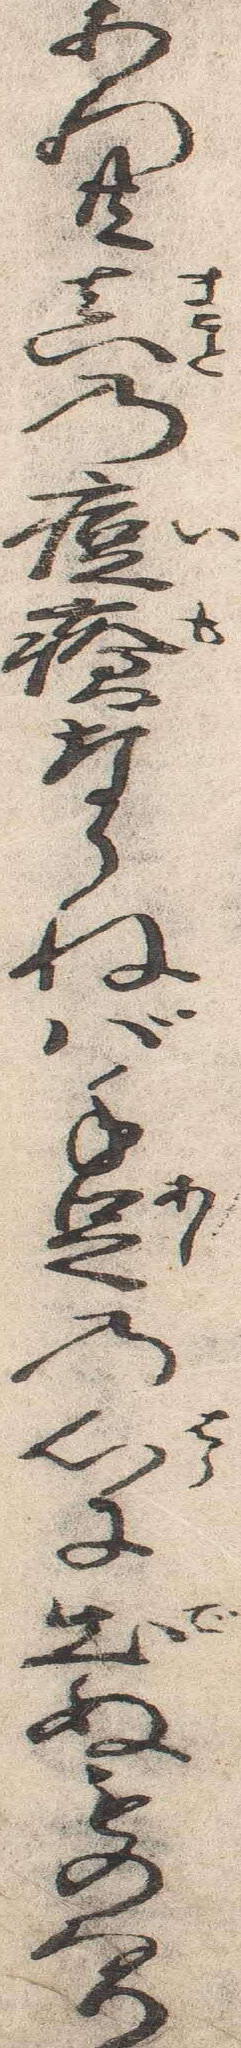あれ共真の痘瘡ならねば手足の心に出ぬものなり
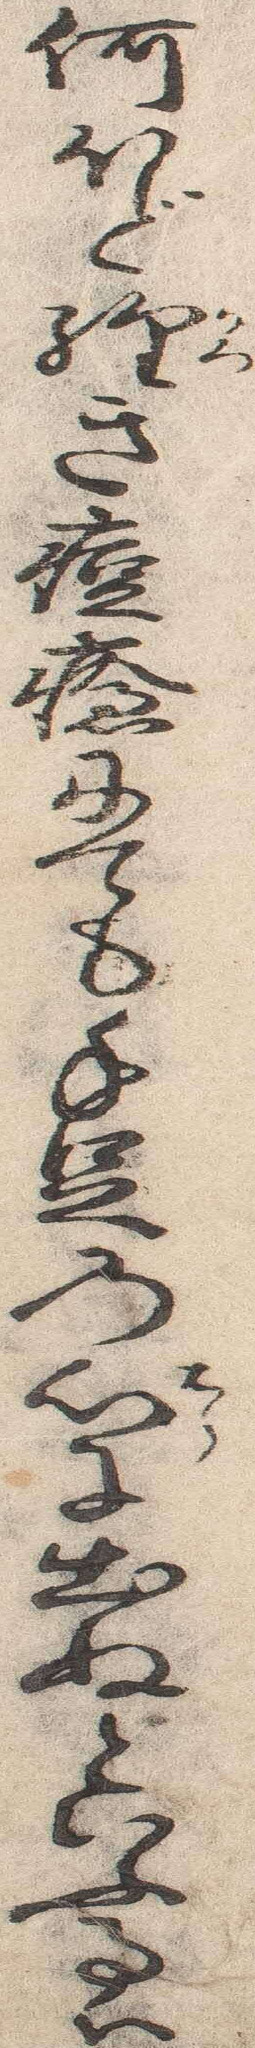何ほど軽き痘瘡にても手足の心に出ぬといふ事は
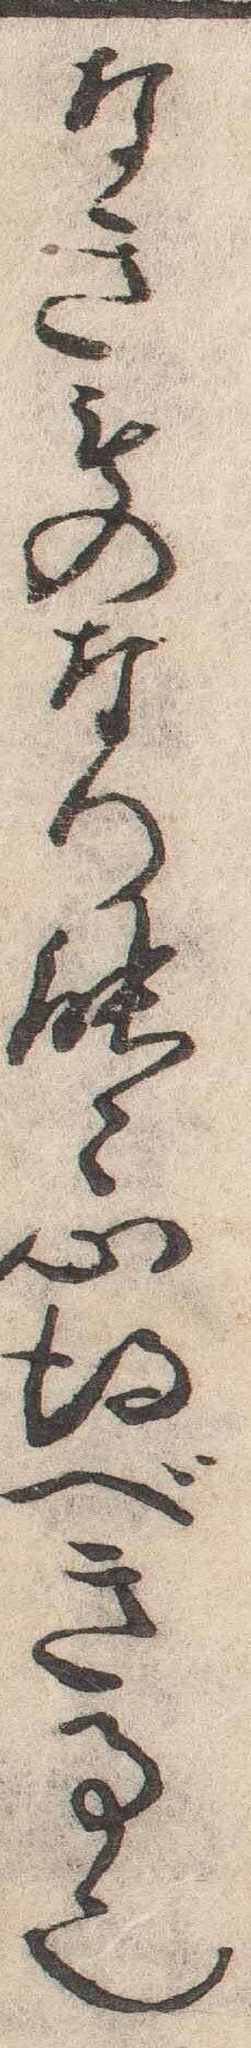なきものなり能々心得べき事也

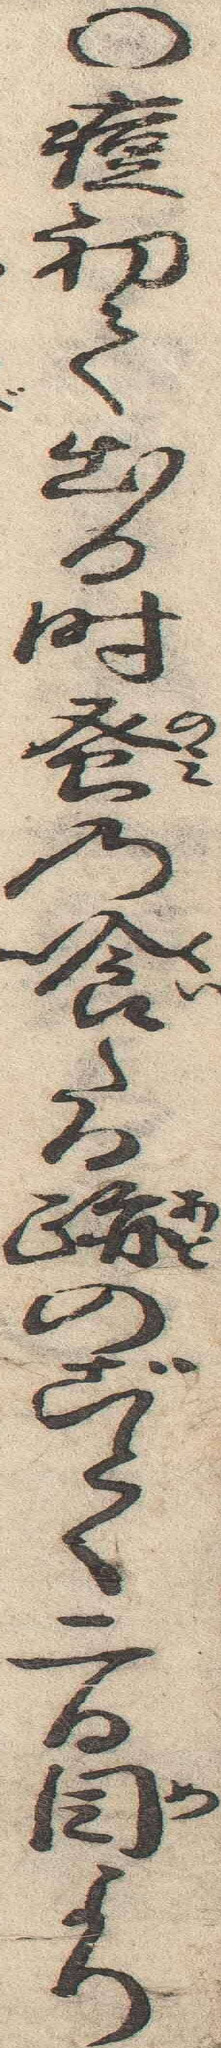痘初て出る時蚤の喰たる跡のごとく二日目より
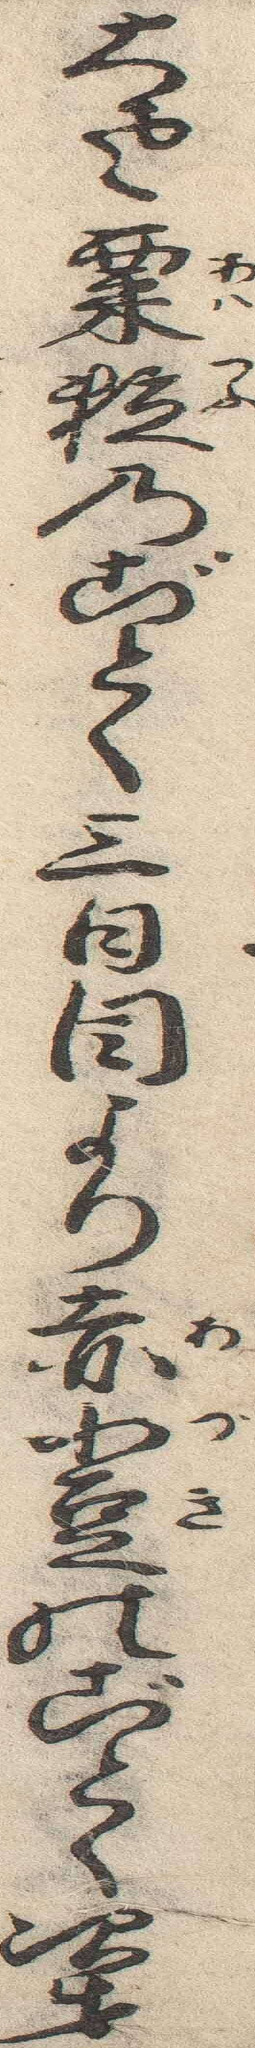大さ粟粒のごとく三日目より赤小豆のごとく次第
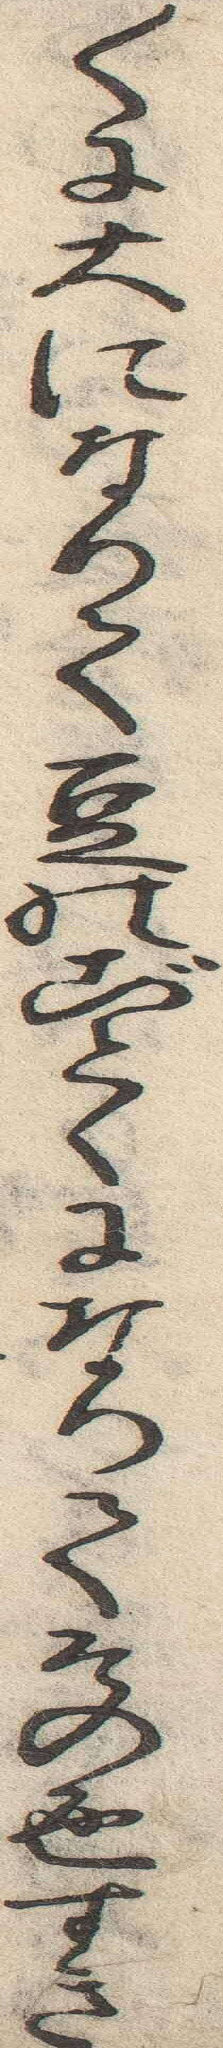〳〵に大になりて豆のごとくになりてその色すき
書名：小児必用養育草
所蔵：東京学芸大学附属図書館 国文学研究資料館
